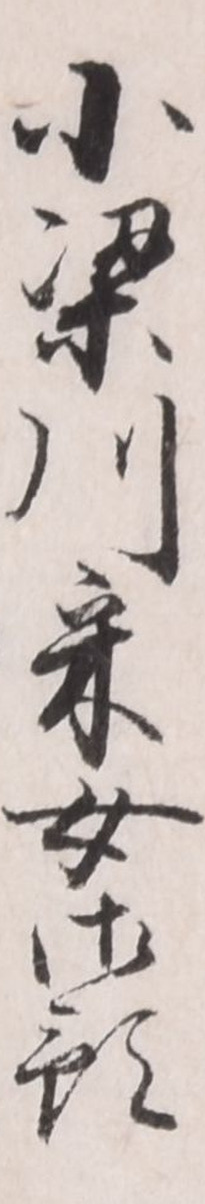小梁川采女御預
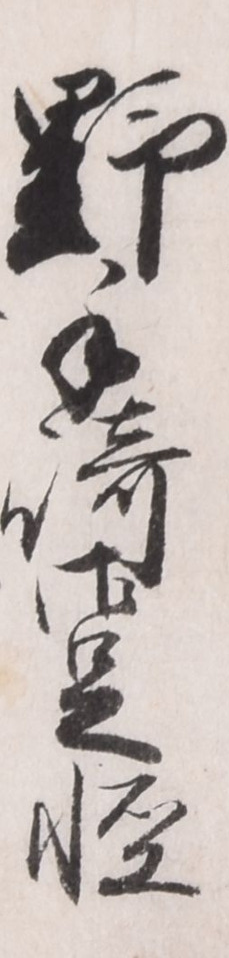野手崎御足軽
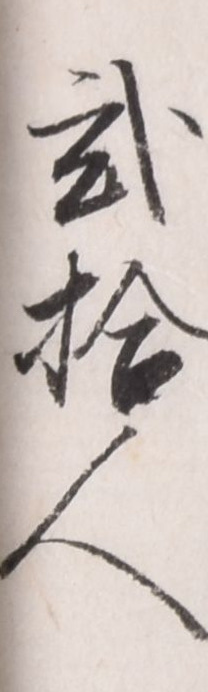弐拾人

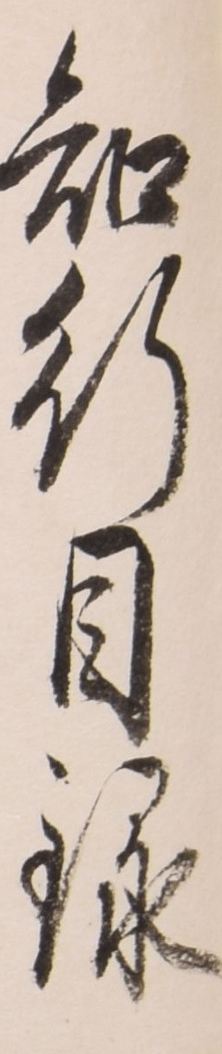知行目録
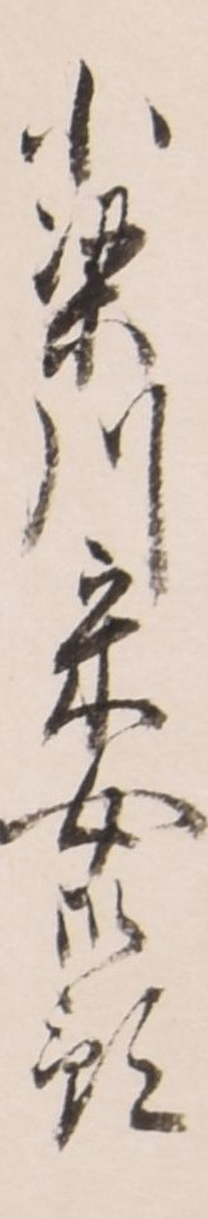小梁川采女御預
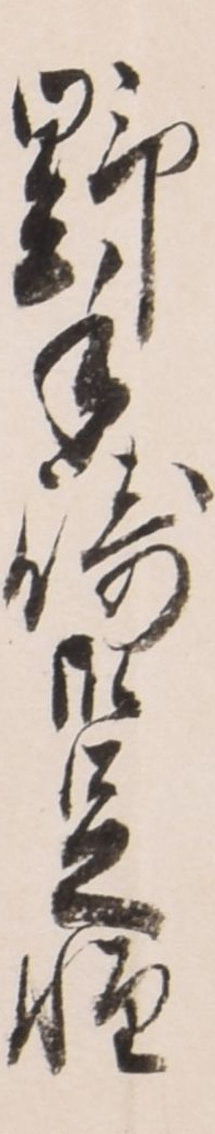野手崎御足軽
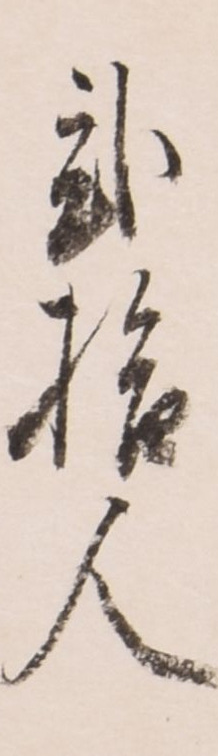弐拾人
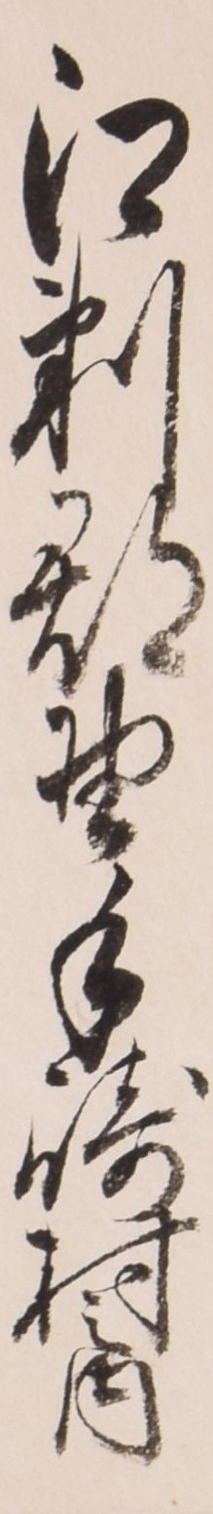江刺郡野手崎村之内
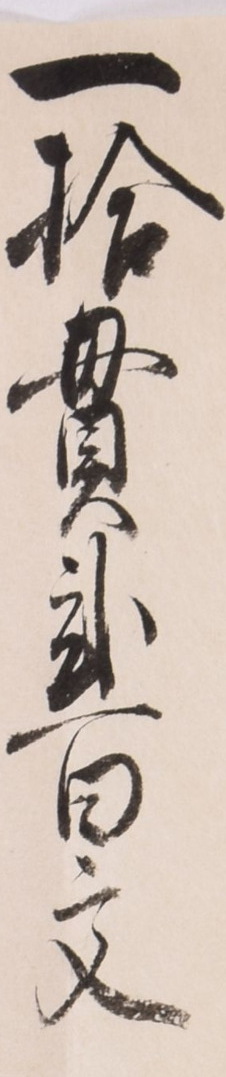一拾貫弐百文
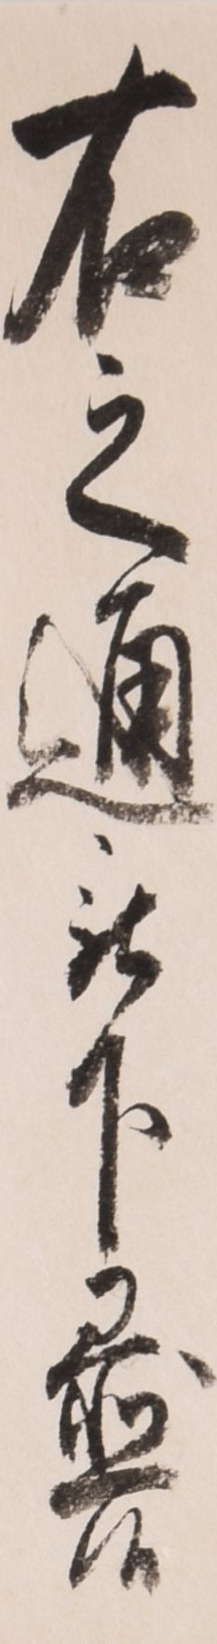右之通被下置候
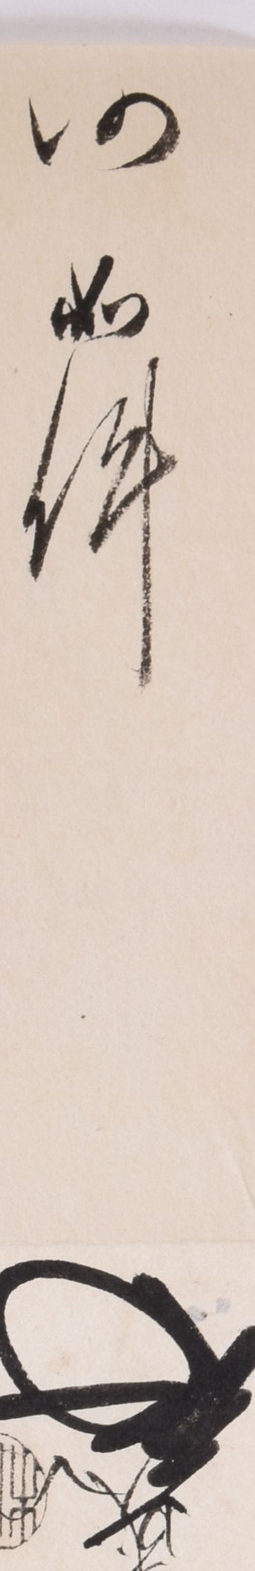仍如件
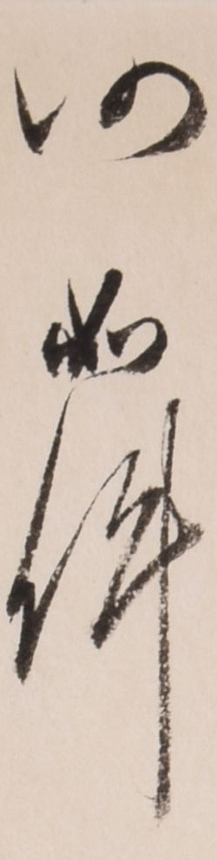仍如件
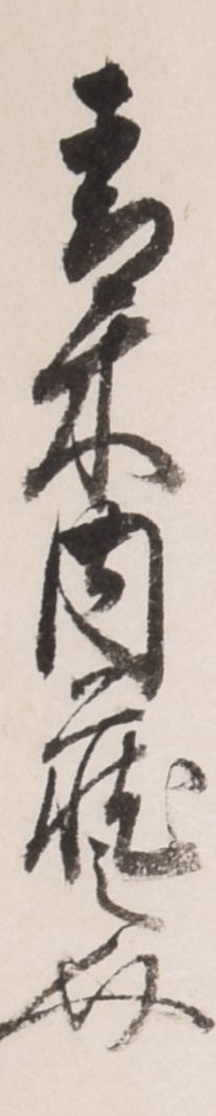青木内蔵介㊞
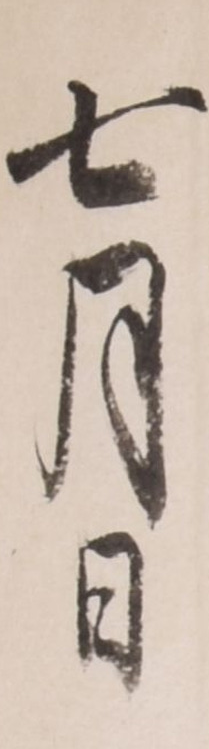七月日
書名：知行目録
